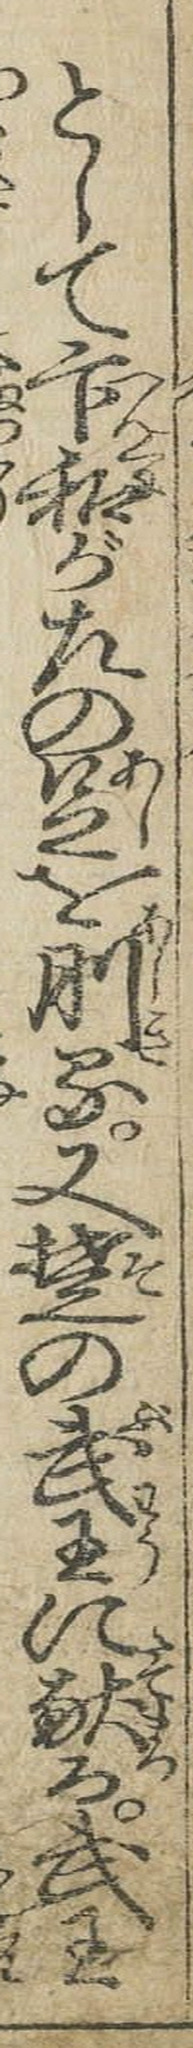として卞和が左の足を刖る。又楚の武王に献る。武王
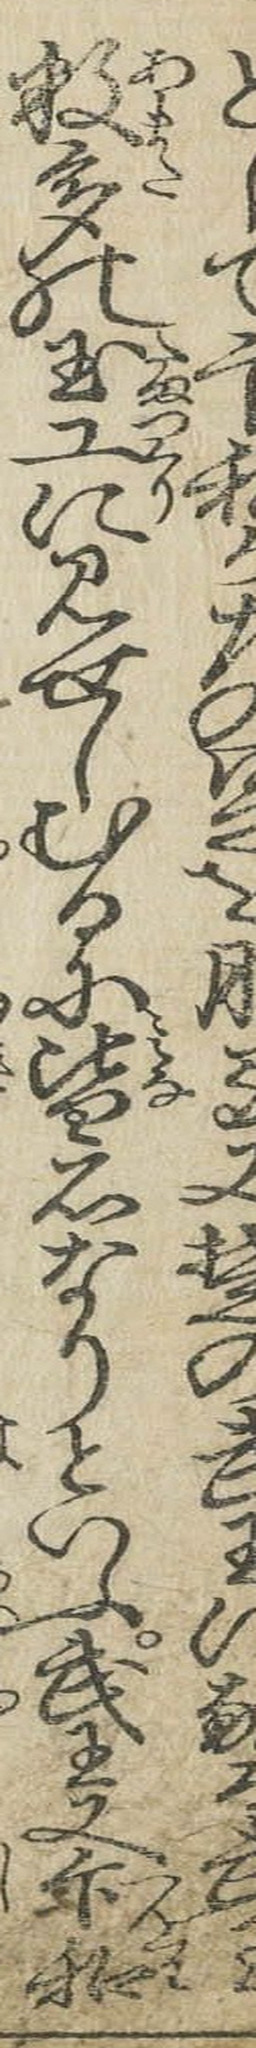数多の玉工に見せしむるに皆石なりといふ。武王又卞和
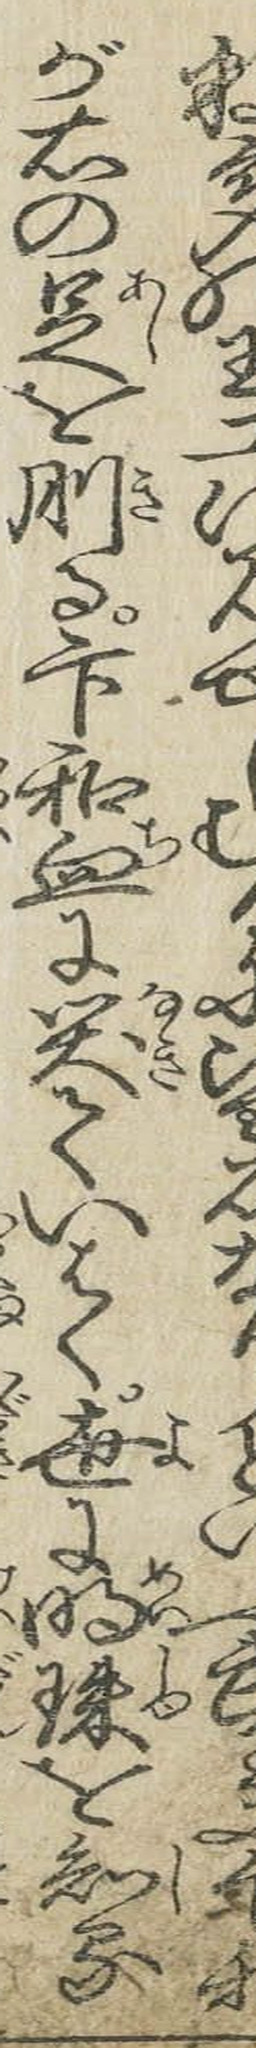が右の足を刖る。卞和血に哭ていはく。世に明珠を知る
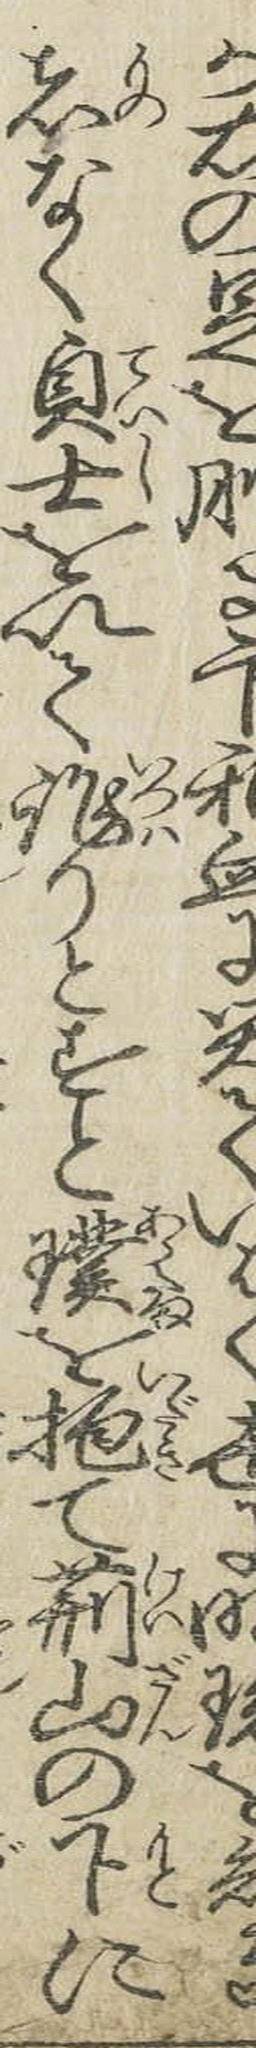者なく貞士を以て詐りとすと璞を抱て荊山の下に
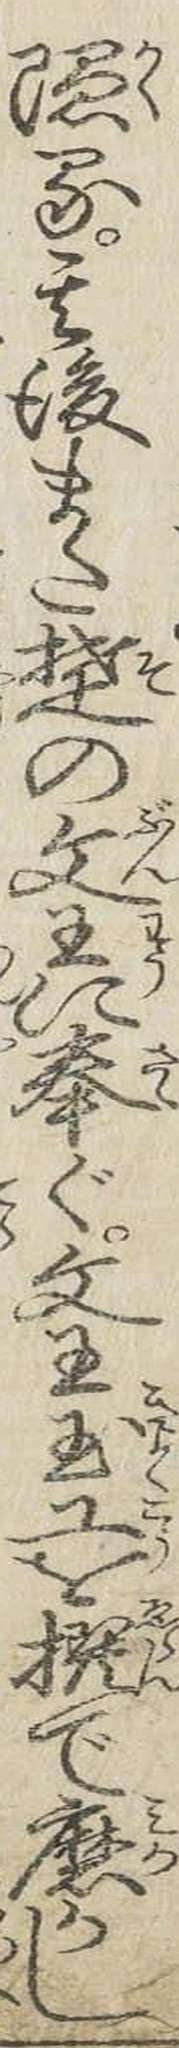隠る。其後また楚の文王に奉ぐ。文王玉工を撰で磨かし
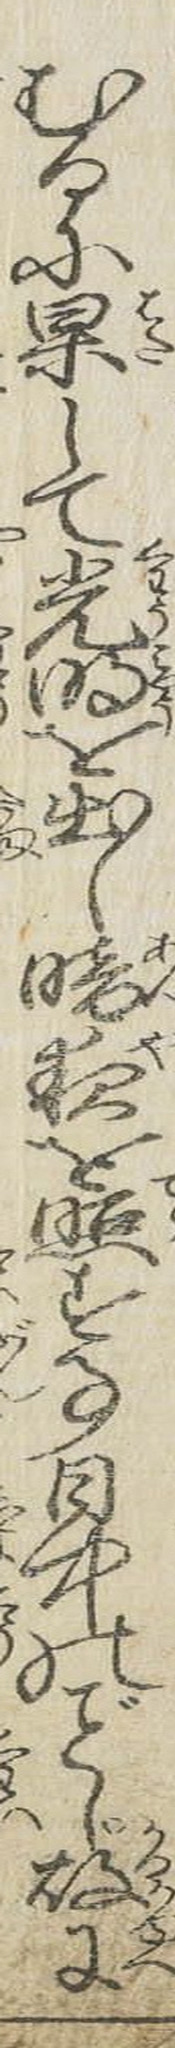むるに果して光明を出し暗夜を照す事日中のごとし。故に
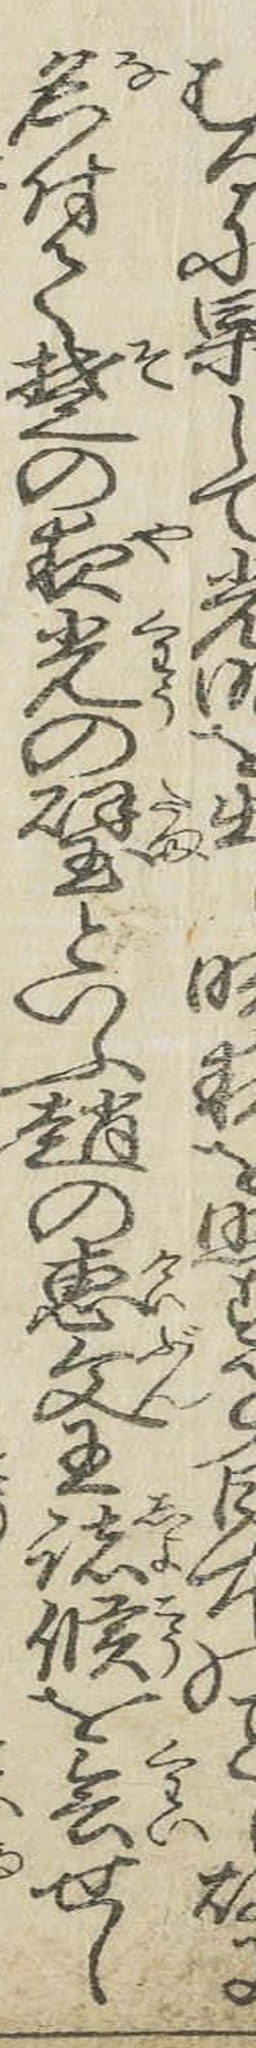名付て楚の夜光の璧といふ趙の恵文王諸侯を会せし
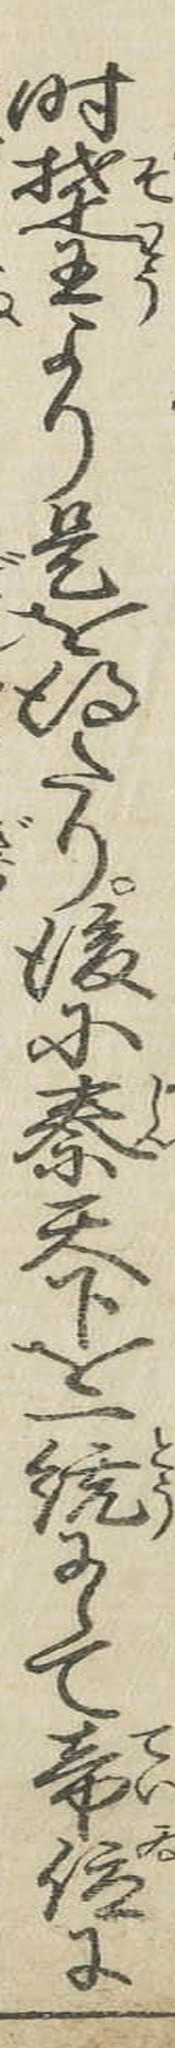時楚王より是を得たり。後に秦天下を一統にして帝位に
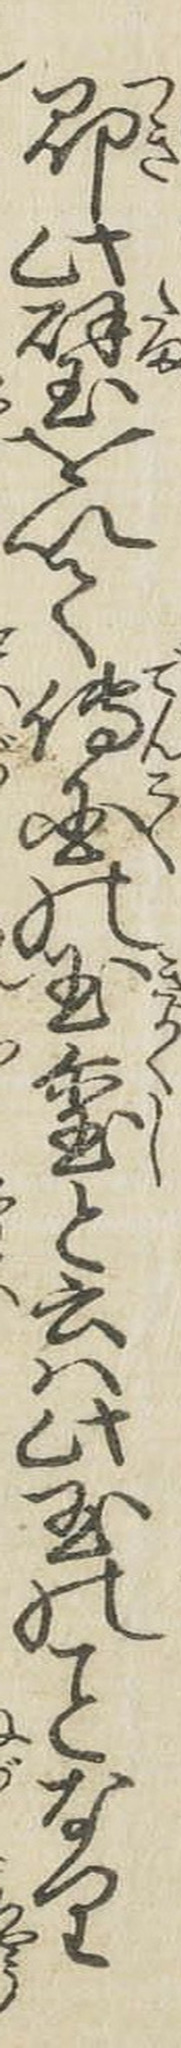即此璧を以て伝国の玉璽と云は此玉のことなり
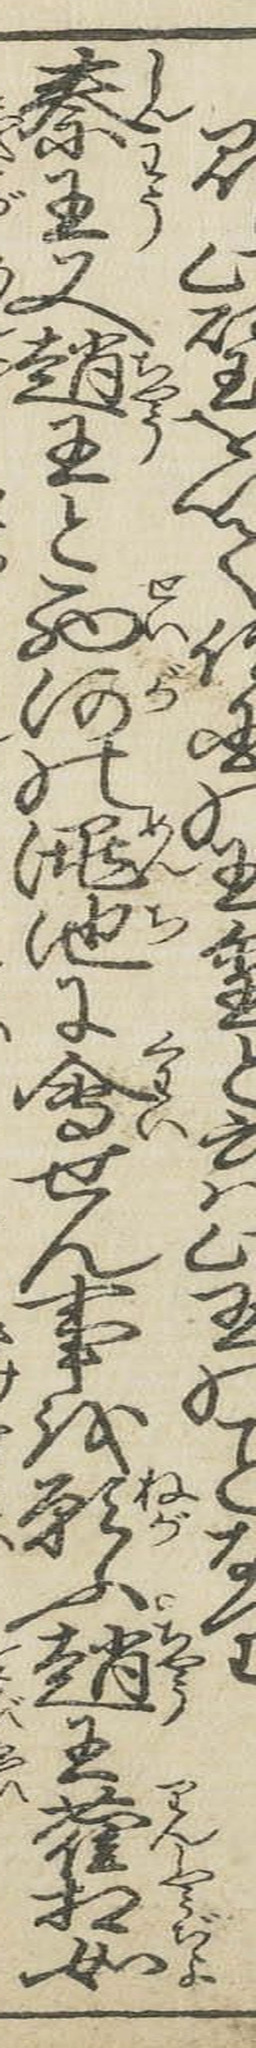秦王又趙王と西河の澠池に会せん事を願ふ。趙王藺相如
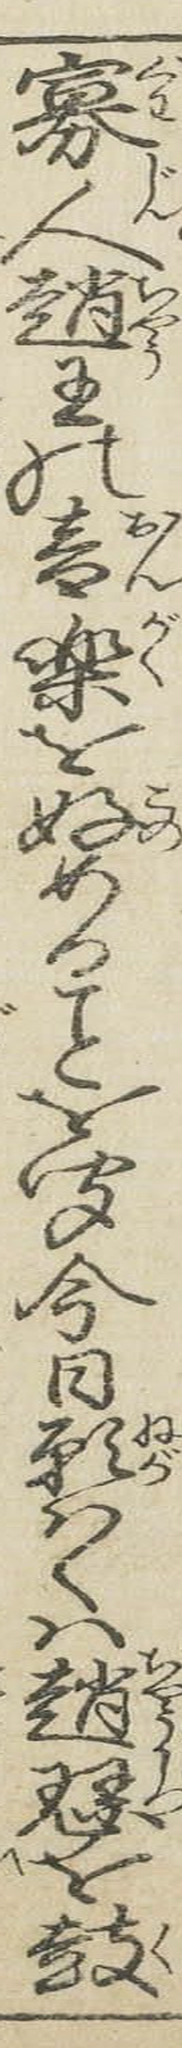寡人趙王の音楽を好めることを聞今日願はくは趙瑟を鼓
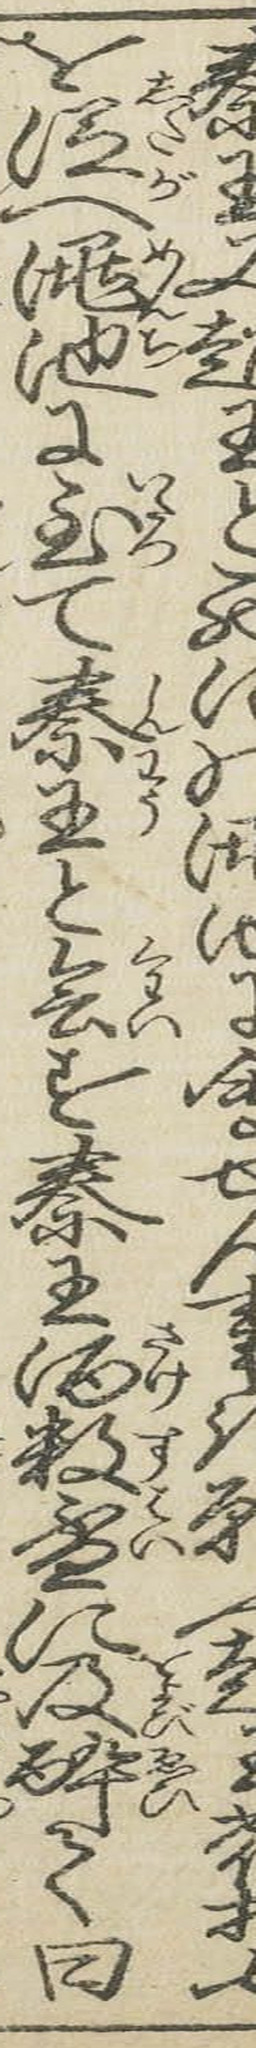を従へ澠池に至て秦王と会す秦王酒数盃に及醉て曰
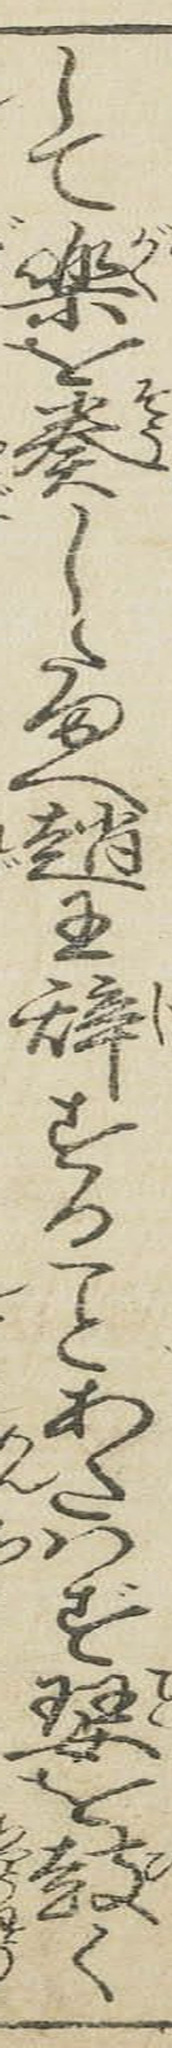して楽を奏したまへ趙王辞することあたはず琴を鼓く
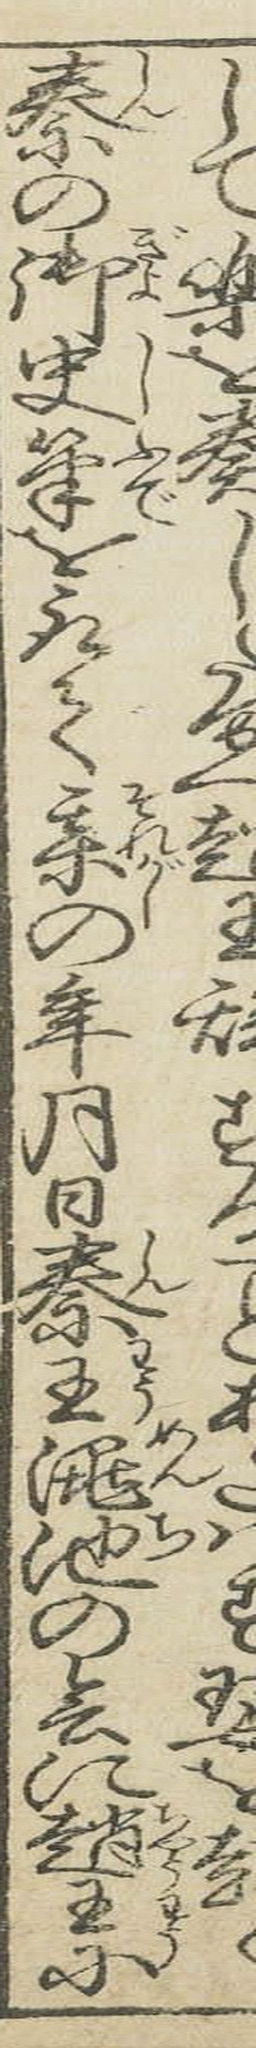秦の御史筆を取て某の年月日秦王澠池の会に趙王に
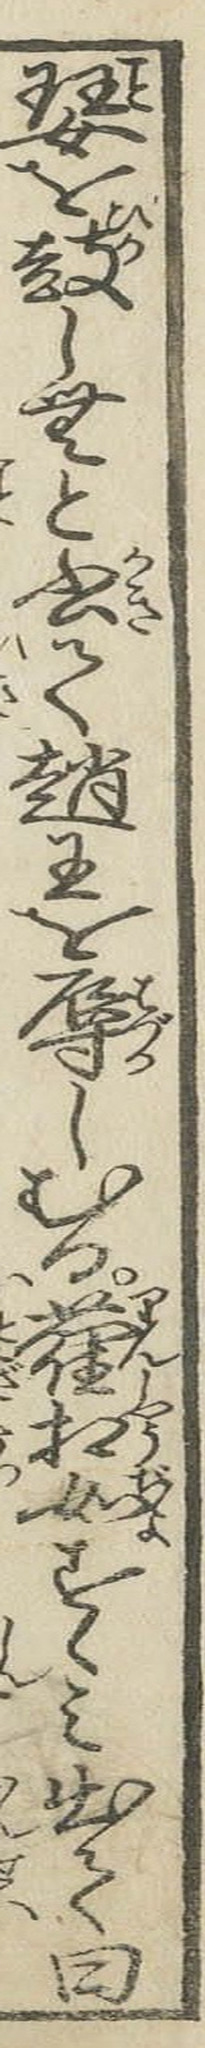琴を鼓しむと書て趙王を辱しむる。藺相如すゝみ出て曰
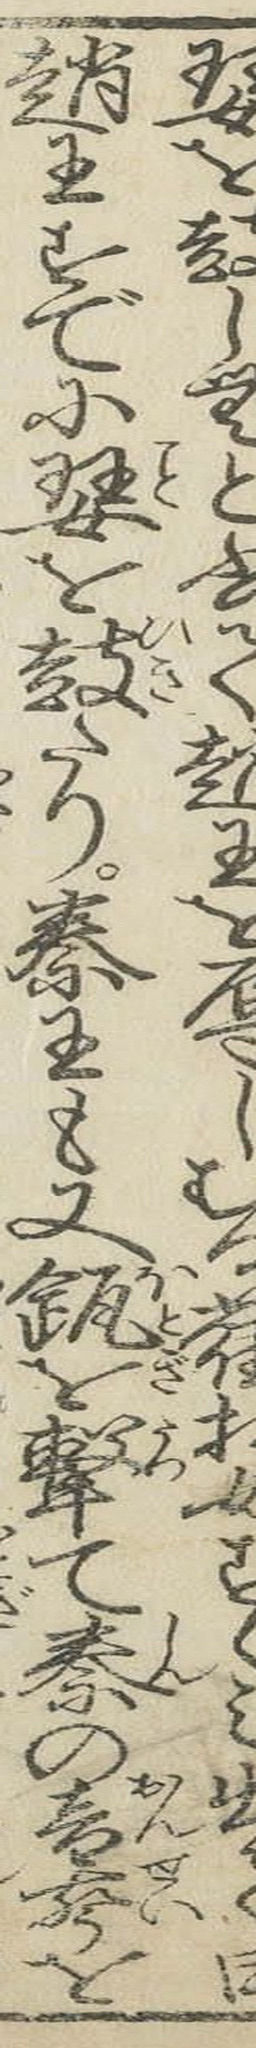趙王すでに琴を鼓たり秦王も又缻を撃て秦の音声を
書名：絵本写宝袋 9巻 6之巻
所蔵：東京学芸大学教育コンテンツアーカイブ
